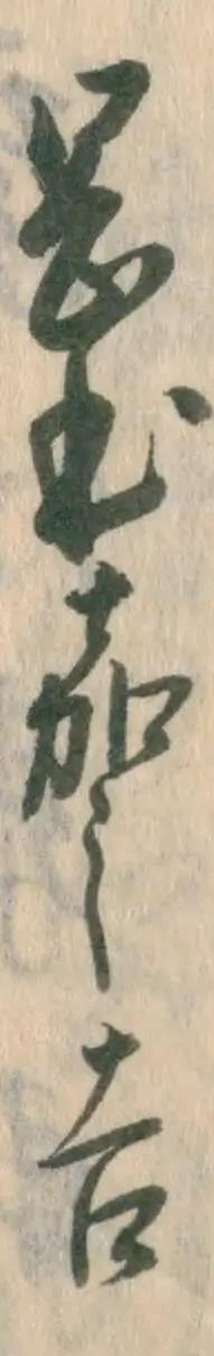岡本嘉之吉
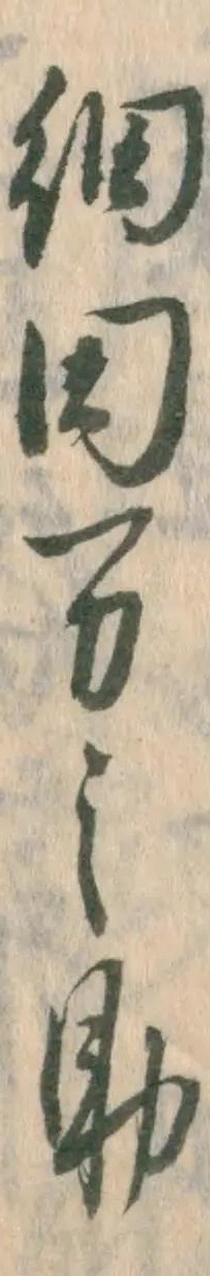細田万ノ助
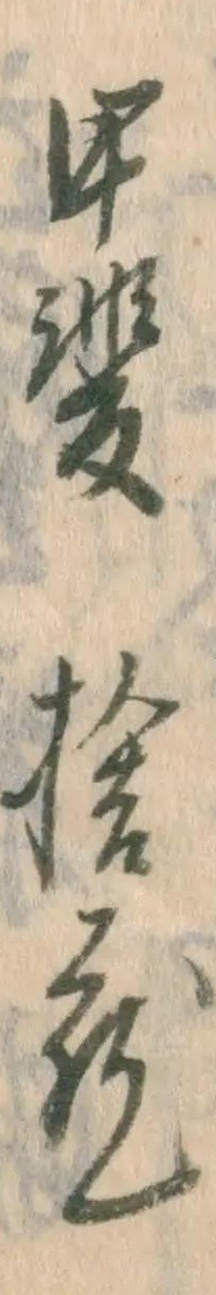甲斐捨蔵
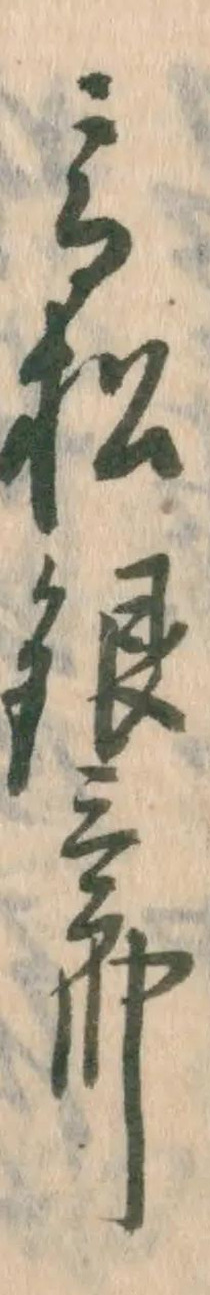高松銀三郎
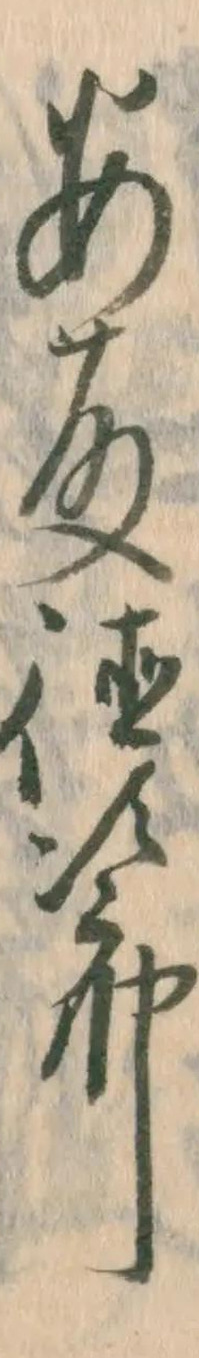安藤徳次郎
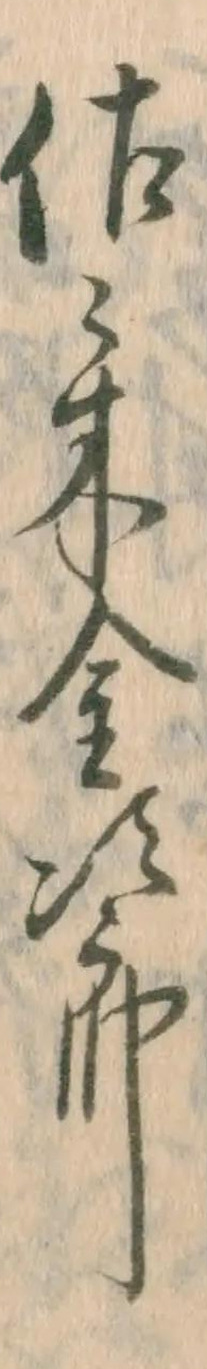佐〻木金次郎
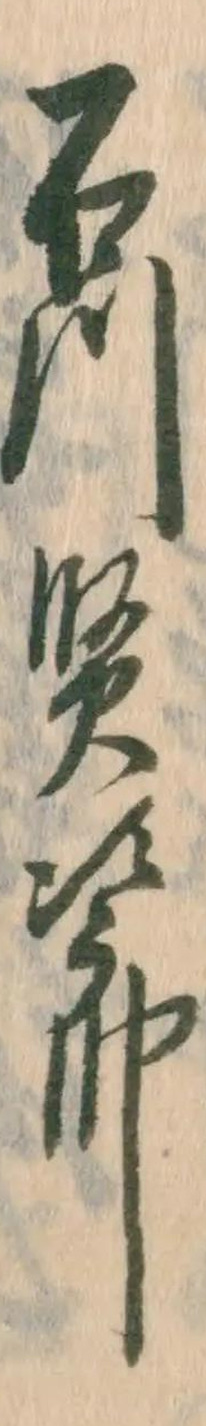石川賢次郎
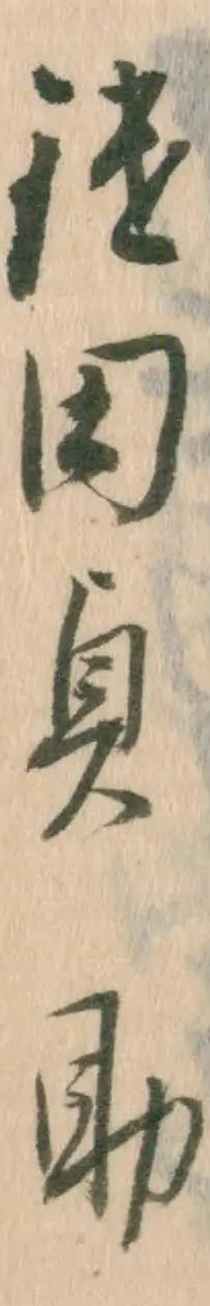遣田貞助
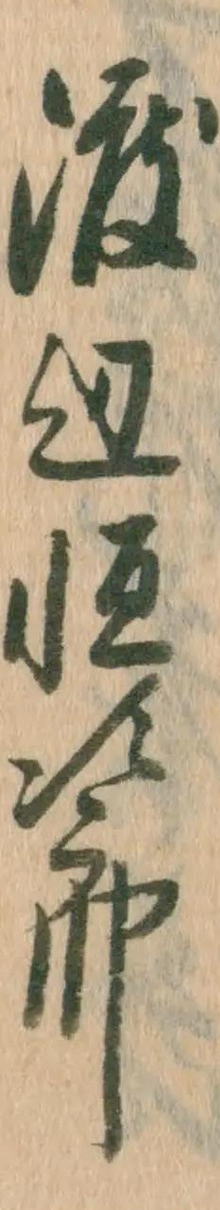渡辺恒次郎
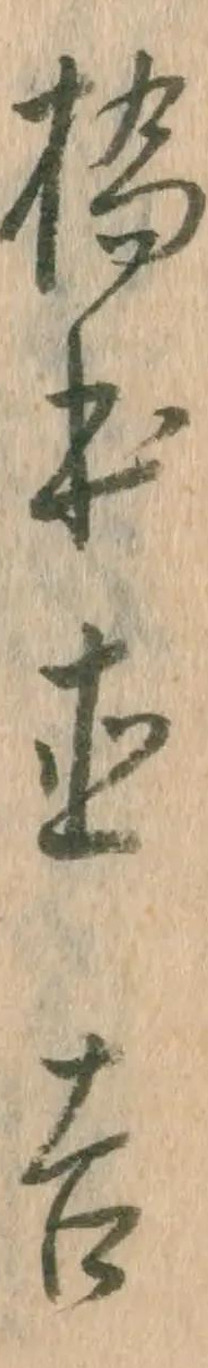橋本直吉
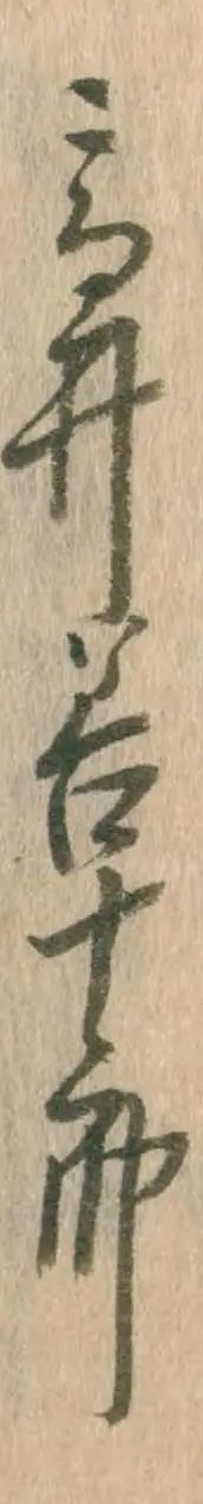高井善十郎
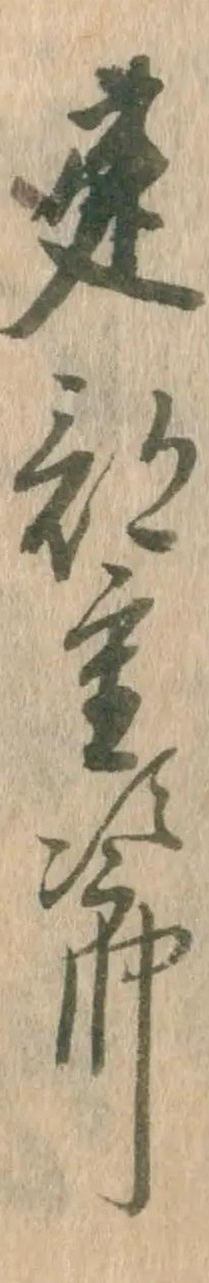建部重次郎
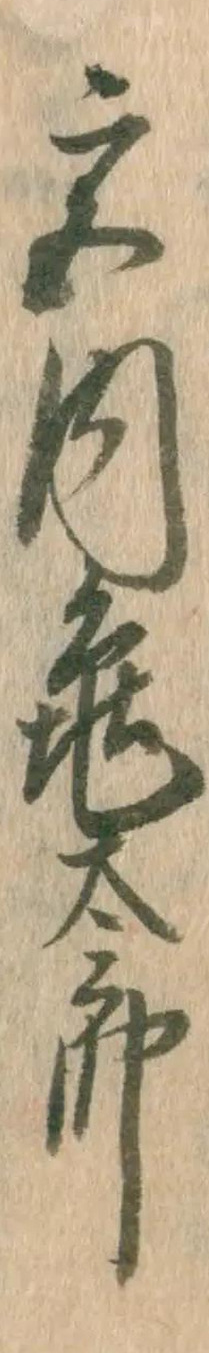宮内亀太郎
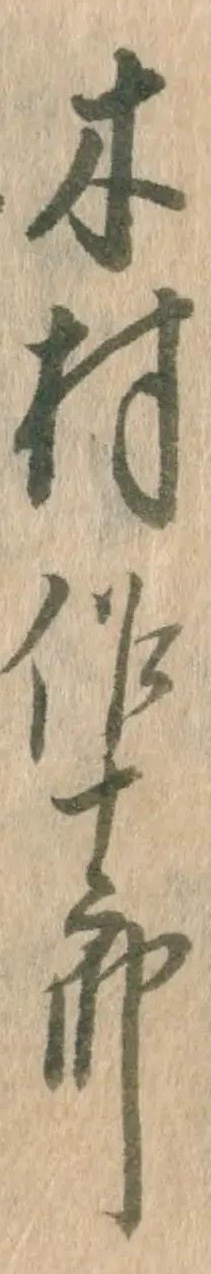木村作十郎
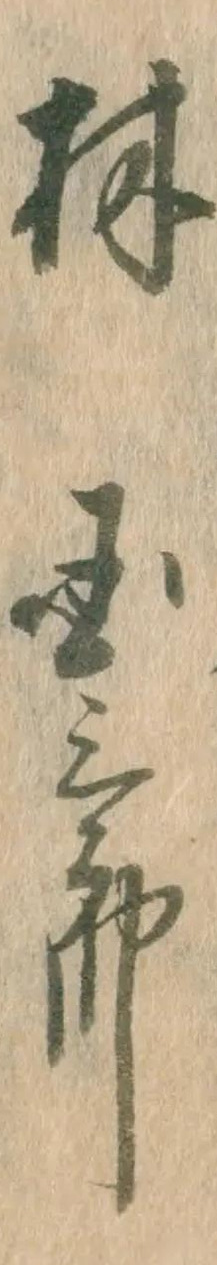林国三郎
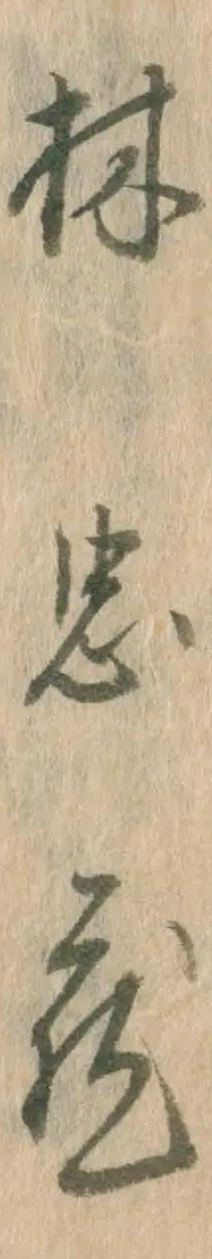林忠蔵
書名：七十冊物類集 71巻. [44] 四十三 牢屋敷御普請御修覆地震ニ付骨折候牢屋掛御褒美之部
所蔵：国立国会図書館 National Diet Library, JAPAN
